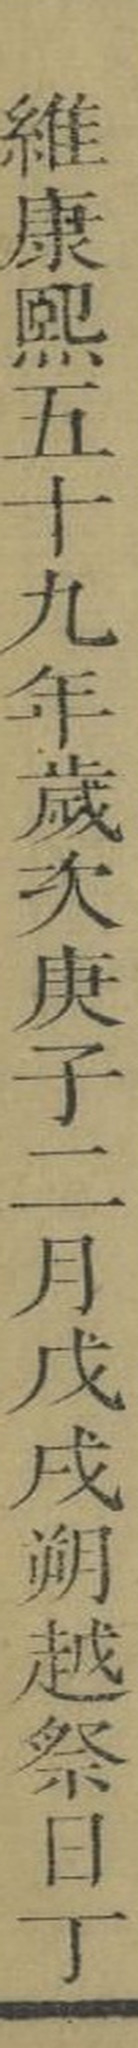維康熙五十九年歲次庚子二月戊戌朔越祭日丁

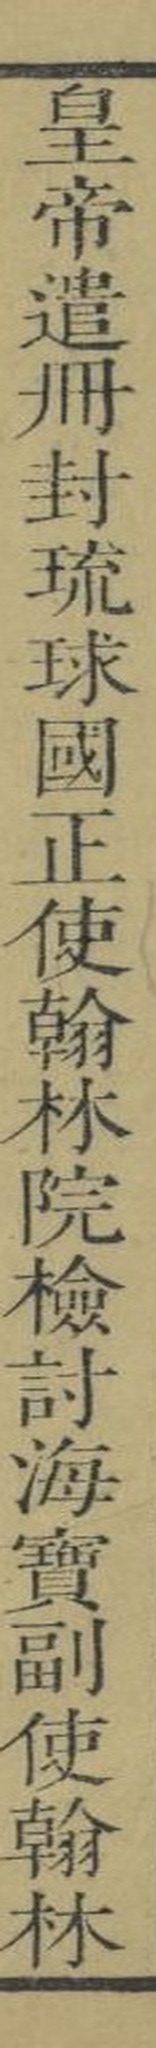皇帝遣冊封琉球國正使翰林院檢討海寶副使翰林
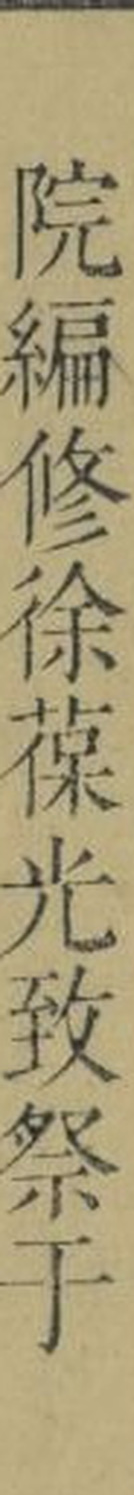院編修徐葆光致祭于
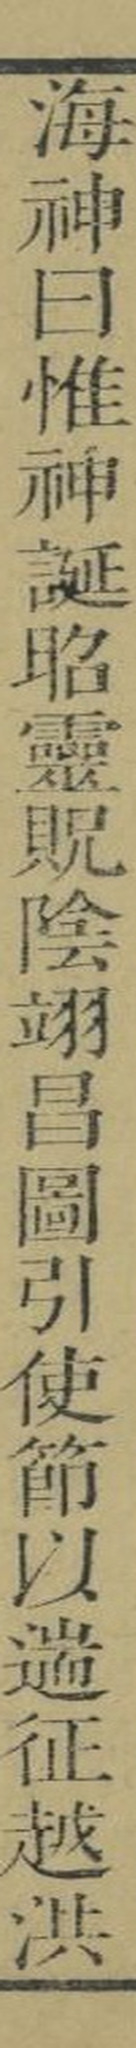海神曰惟神誕昭靈貺陰翊昌圖引使節以遄征越洪
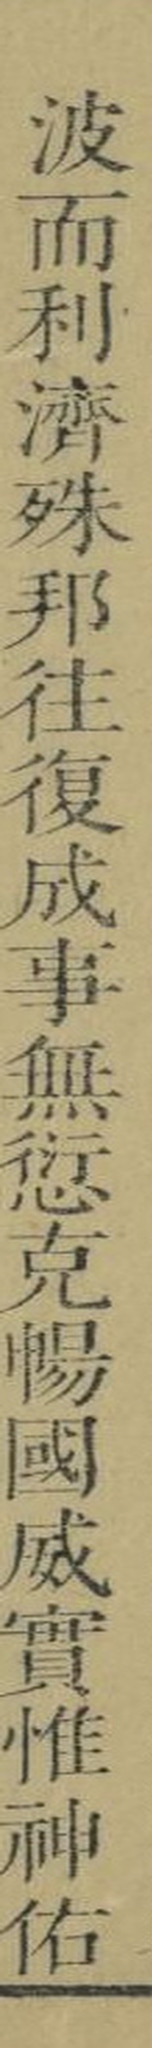波而利濟殊邦往復成事無愆克暢國威實惟神佑
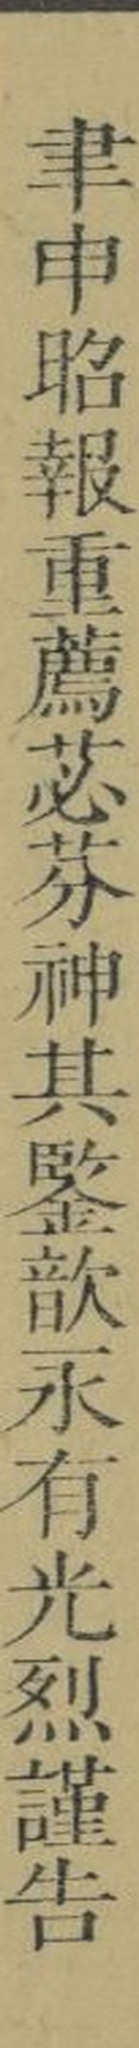聿申昭報重薦苾芬神其鍳歆永有光烈謹告
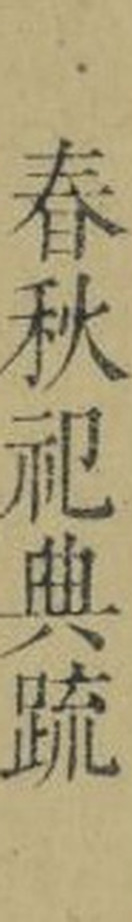春秋祀典䟽
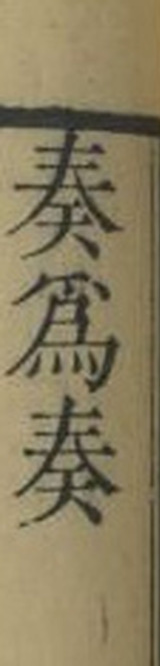奏爲奏
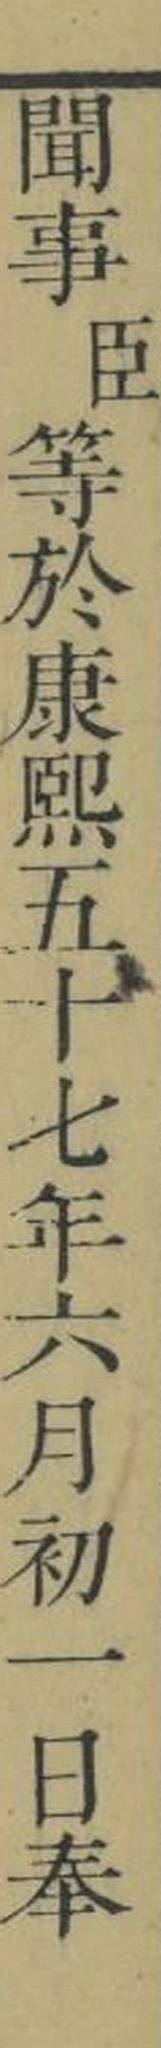聞事臣等於康熙五十七年六月初一日奉
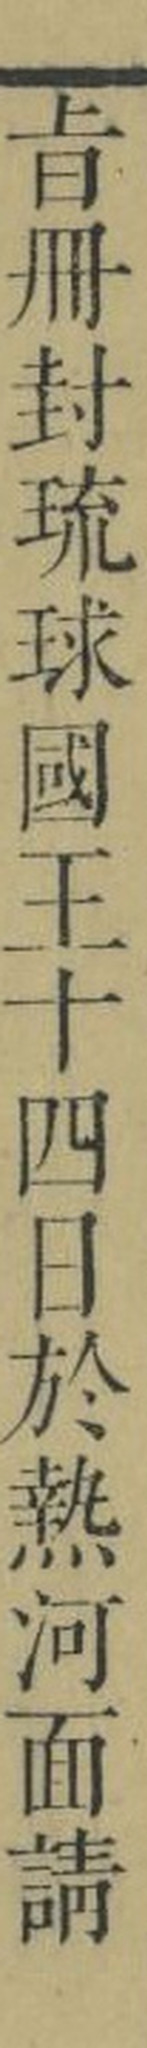㫖冊封琉球國王十四日於𤍠河面請
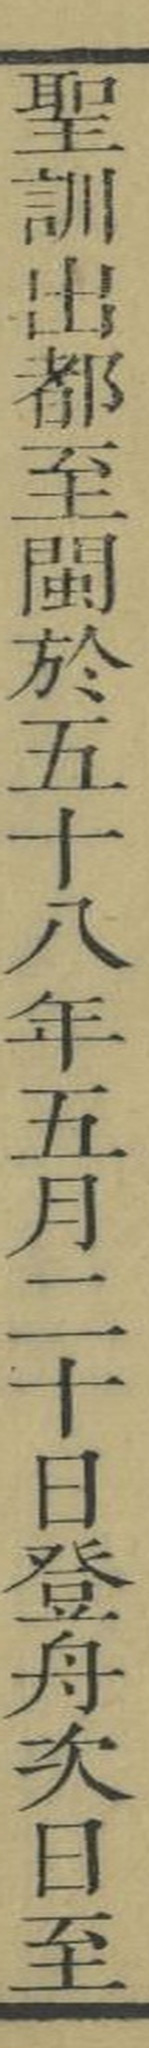聖訓出都至閩於五十八年五月二十日登舟次日至
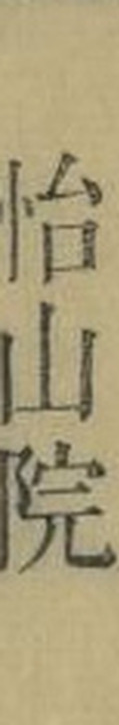怡山院
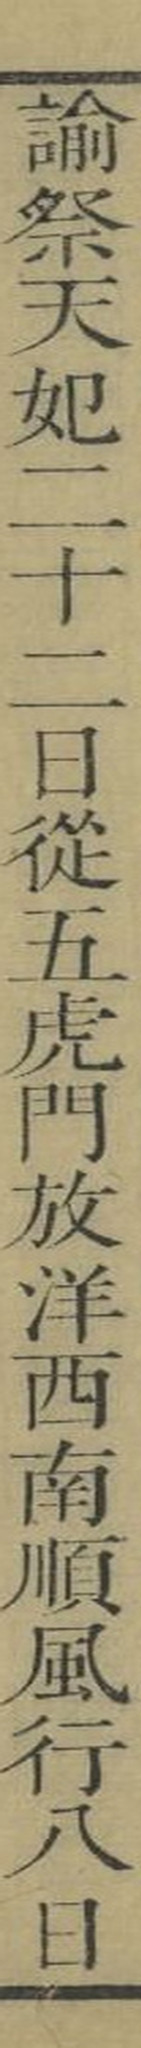諭祭天妃二十二日從五虎門放洋西南順風行八日
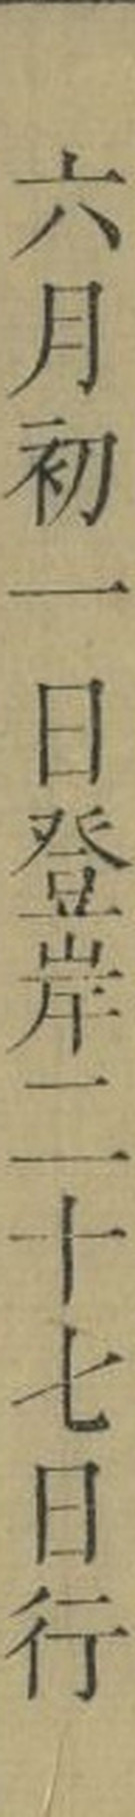六月初一日登岸二十七日行
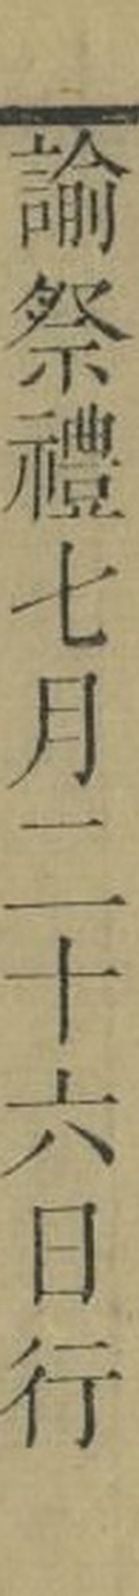諭祭禮七月二十六日行
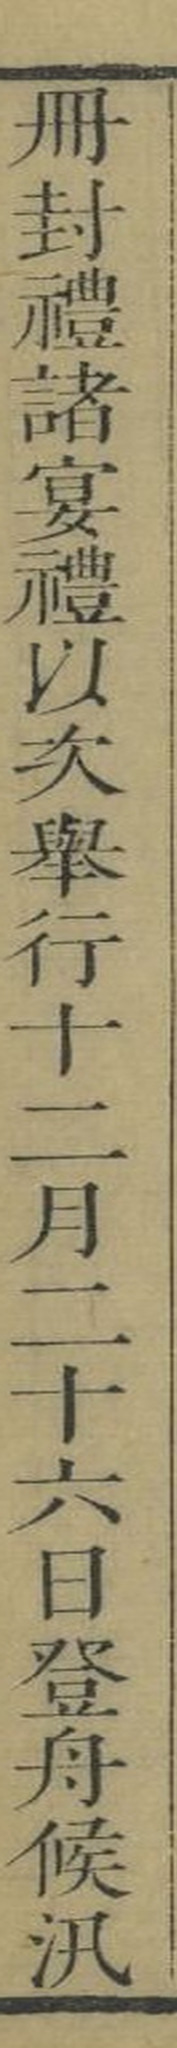冊封禮諸宴禮以次舉行十二月二十六日登舟候汛
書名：中山伝信録 巻一
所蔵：University of the Ryukyus Library
